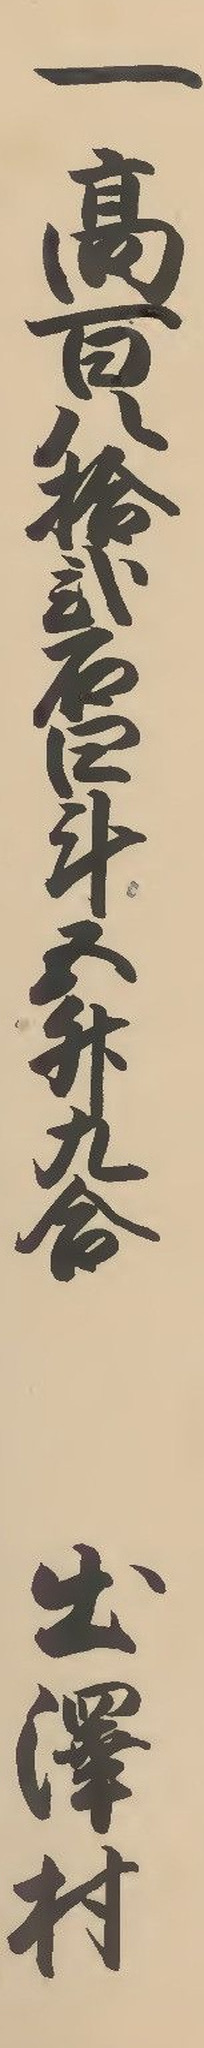一高百八拾弐石四斗五升九合出沢村
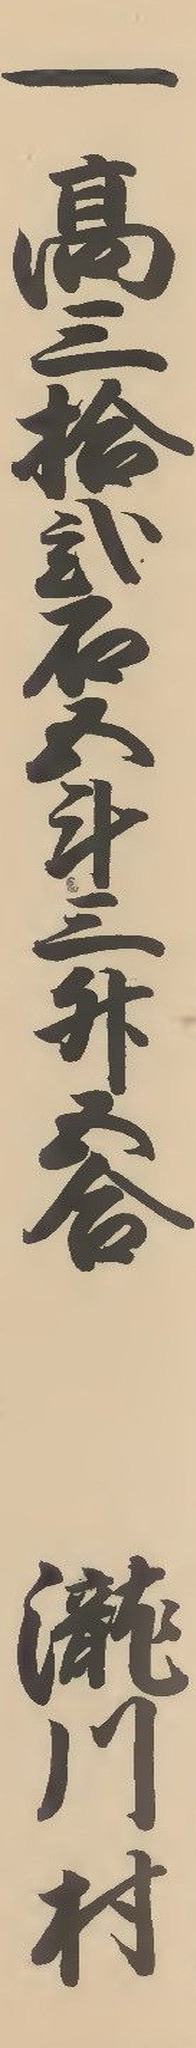一高三拾弐石五斗三升五合滝川村
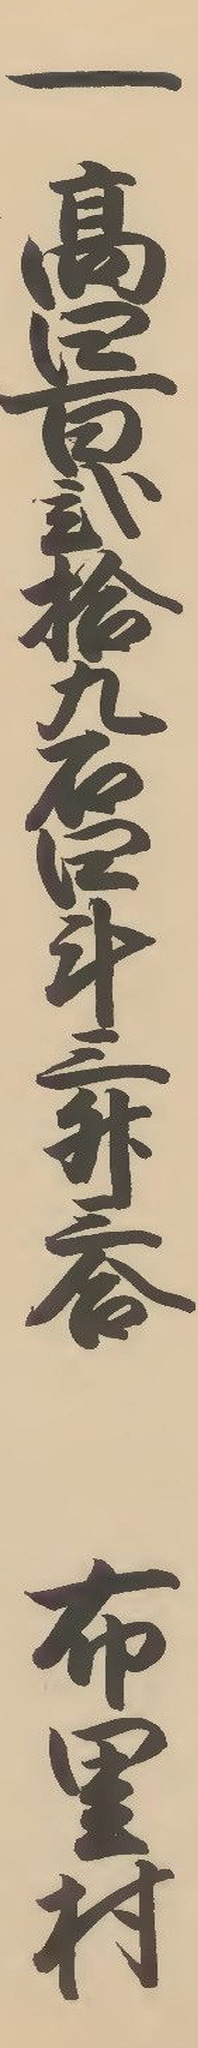一高四百弐拾九石四斗三升三合布里村
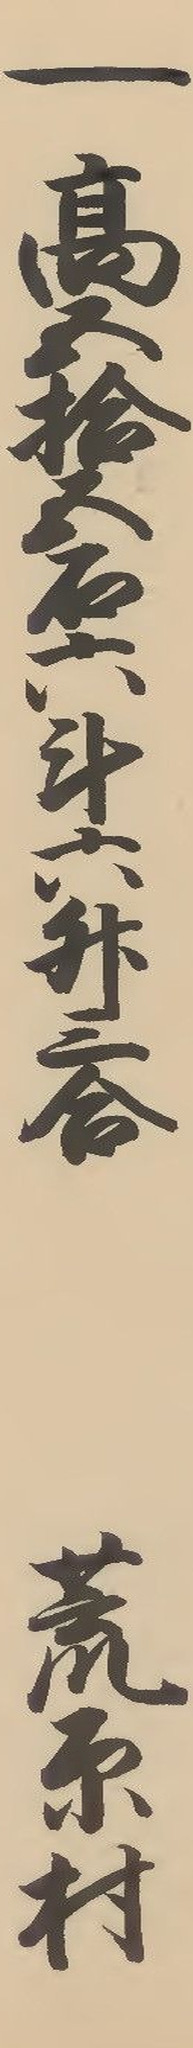一高五拾五石六斗六升三合荒原村
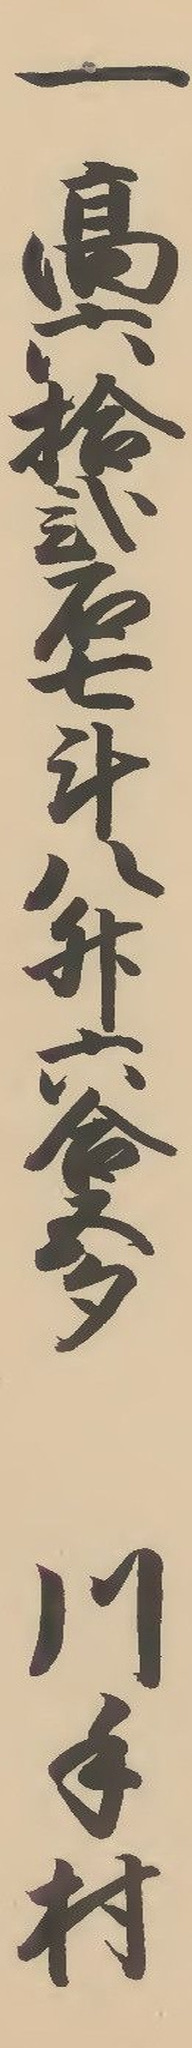一高六拾弐石七斗八升六合五勺川手村

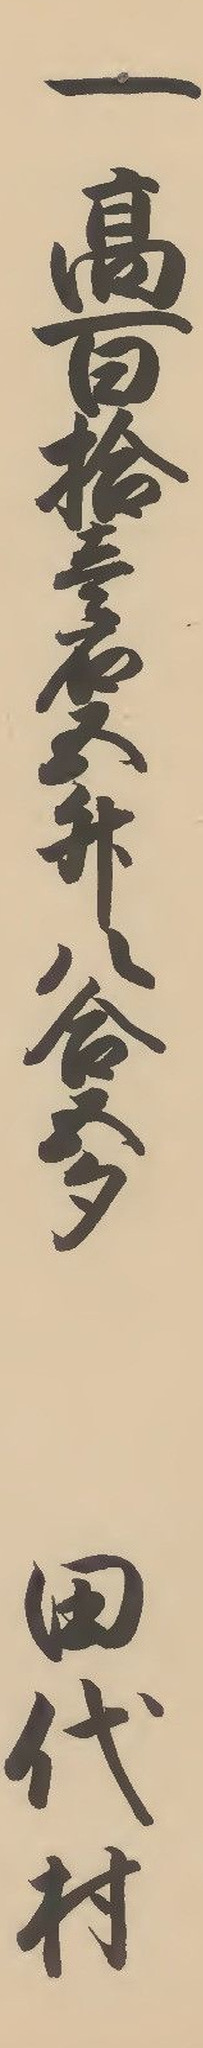一高百拾壱石五升八合五勺田代村
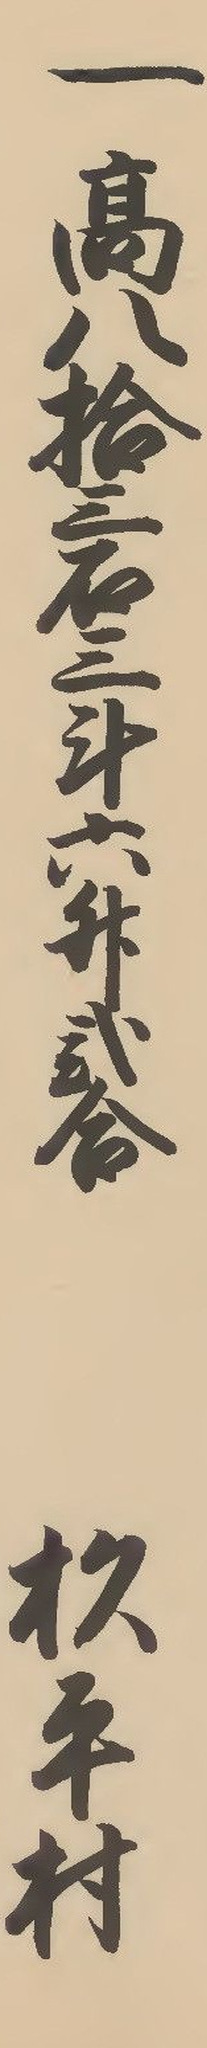一高八拾三石三斗六升弐合杉平村
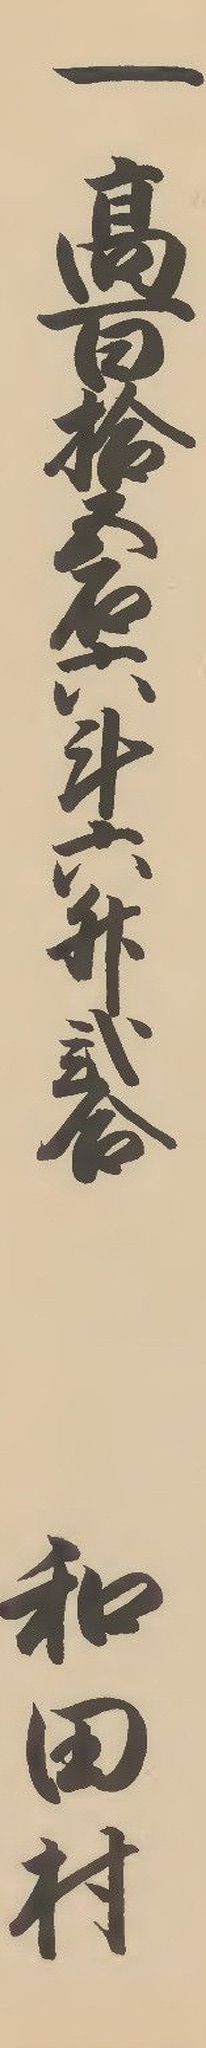一高百拾五石六斗六升弐合和田村
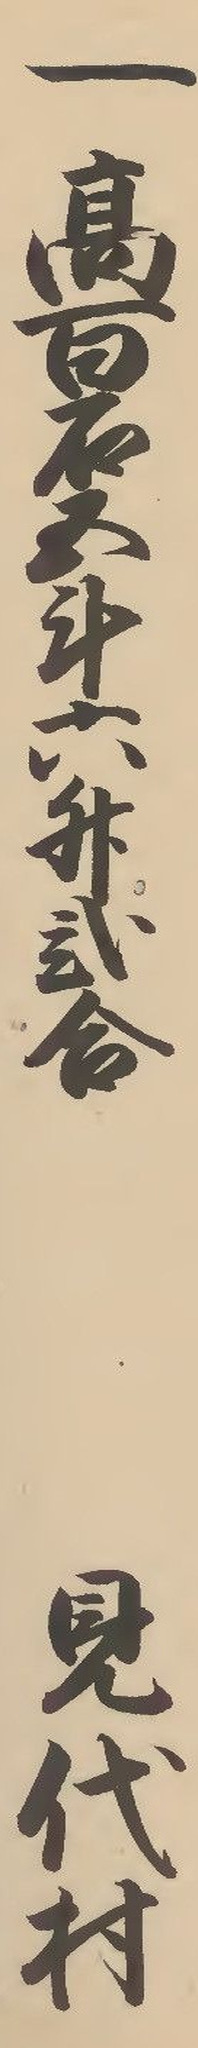一高百石五斗六升弐合見代村
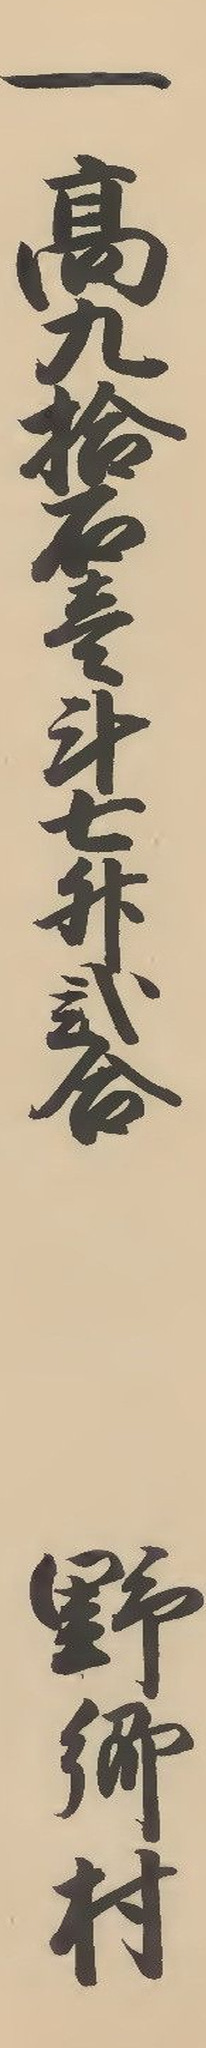一高九拾石壱斗七升弐合野郷村
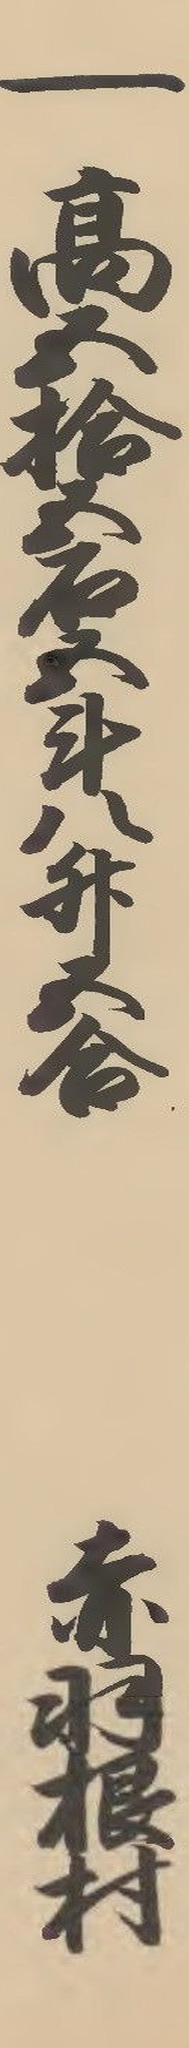一高五拾五石五斗八升五合赤羽根村
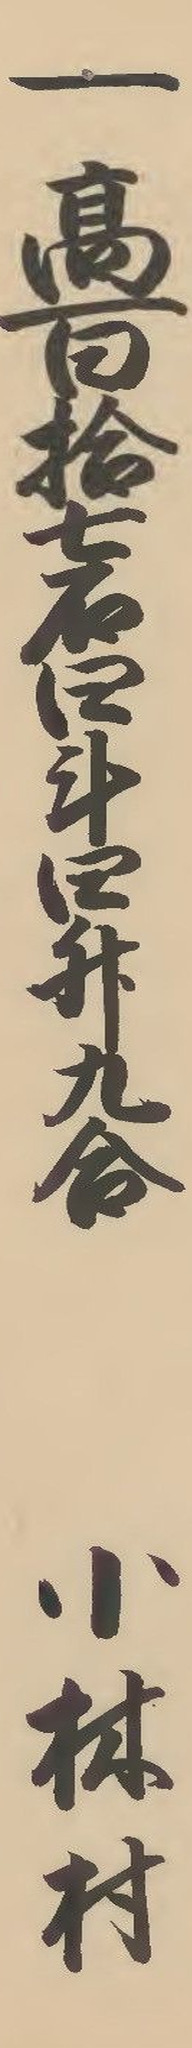一高百拾七石四斗四升九合小林村

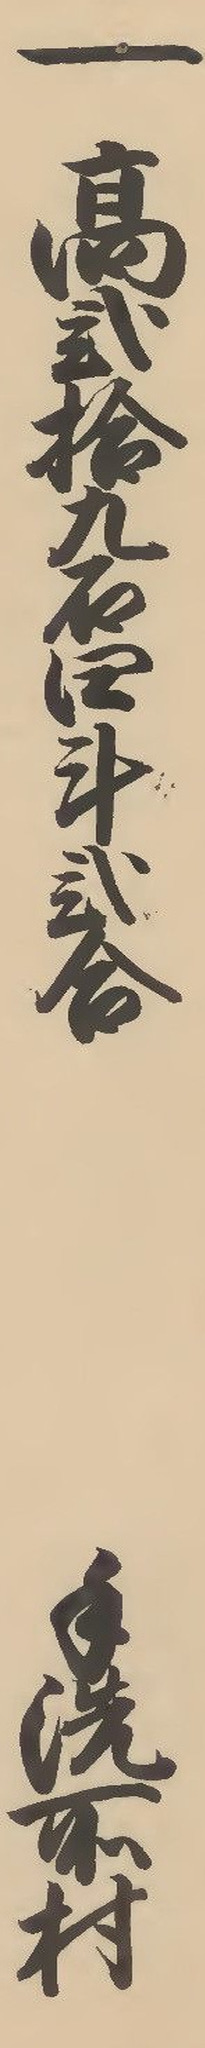一高弐拾九石四斗弐合手洗所村
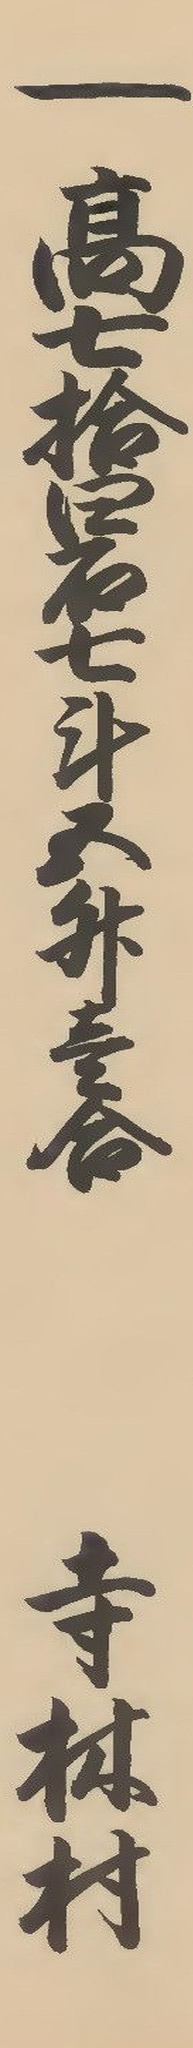一高七拾四石七斗五升壱合寺林村
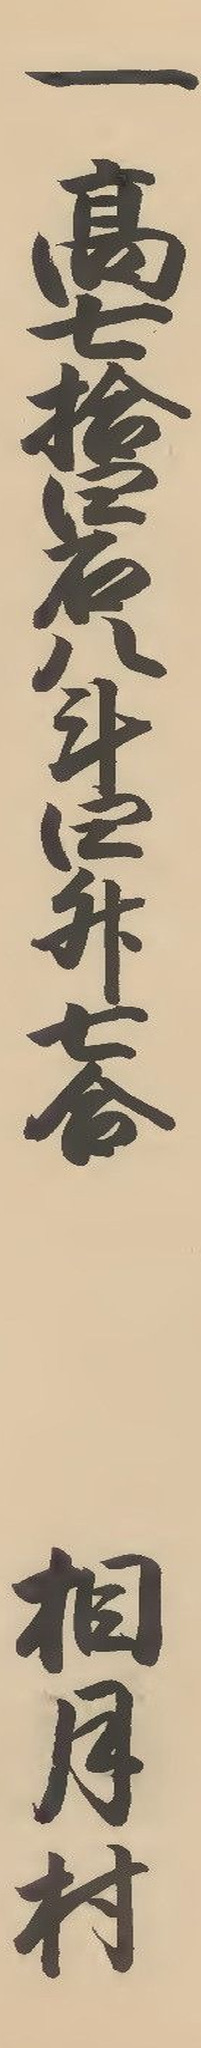一高七拾四石八斗四升七合相月村
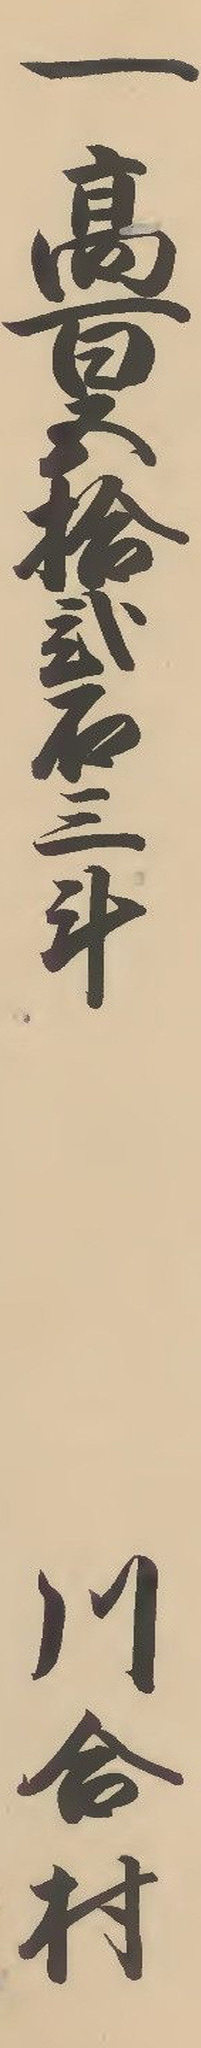一高百五拾弐石三斗川合村
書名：三河国郷帳
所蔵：国立公文書館 National Archives of Japan
